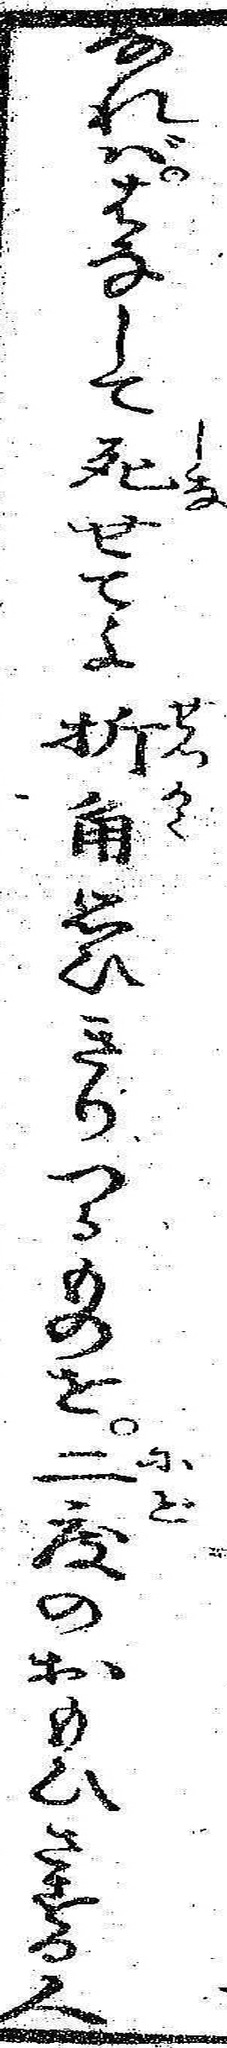なれば。はなして死せてよ折角思ひきりつるものを。二度のおもひさする人
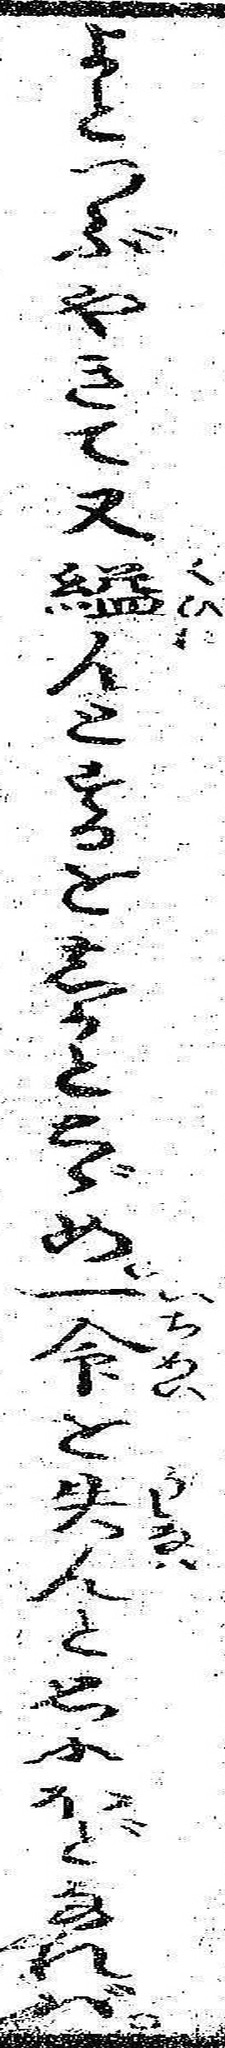よとつぶやきて又縊んとするをしかととゞめ。一命を失んと思ふほどなれば。
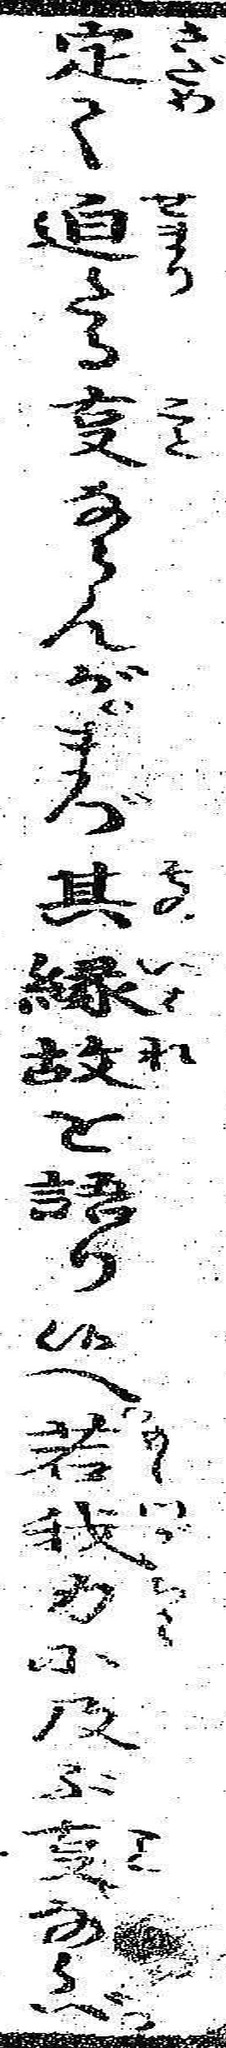定て迫たる事ならんが。まづ其縁故を語り候へ。若我力に及ぶ事ならば。
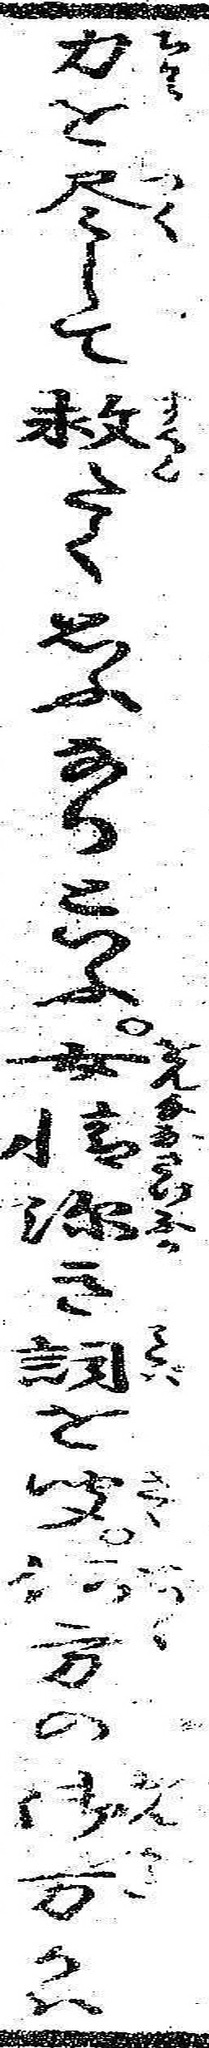力を尽して救たく思ふなりといふ。女情深き詞を聞。何方の御方かは
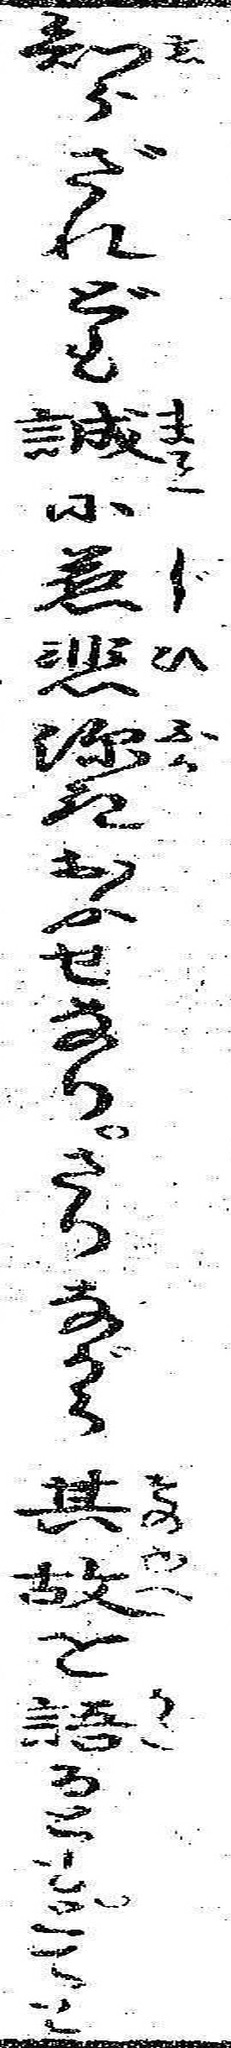知らざれども誠に慈悲深きおふせなり。さりながら其故を語るとも。とても
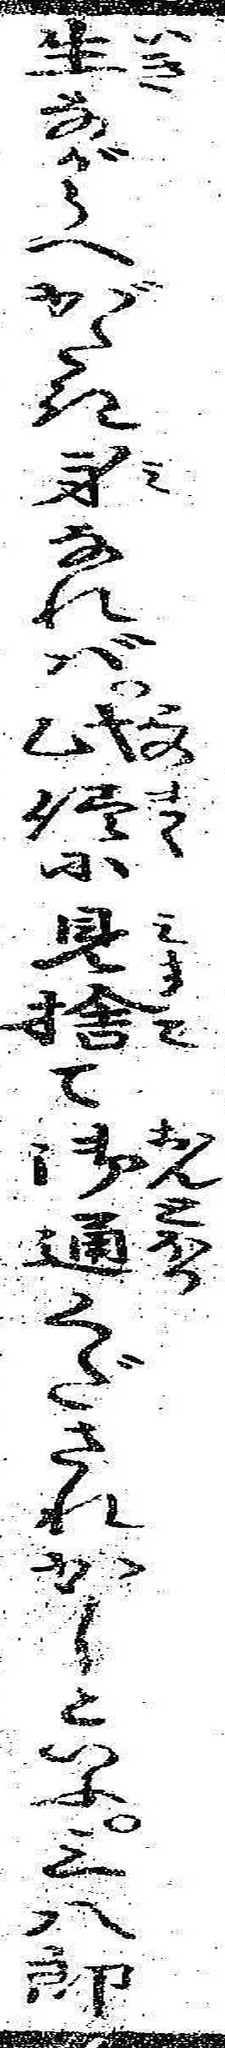生ながらへがたき身なれば。此侭に見捨て御通くだされかしといふ。三八郎
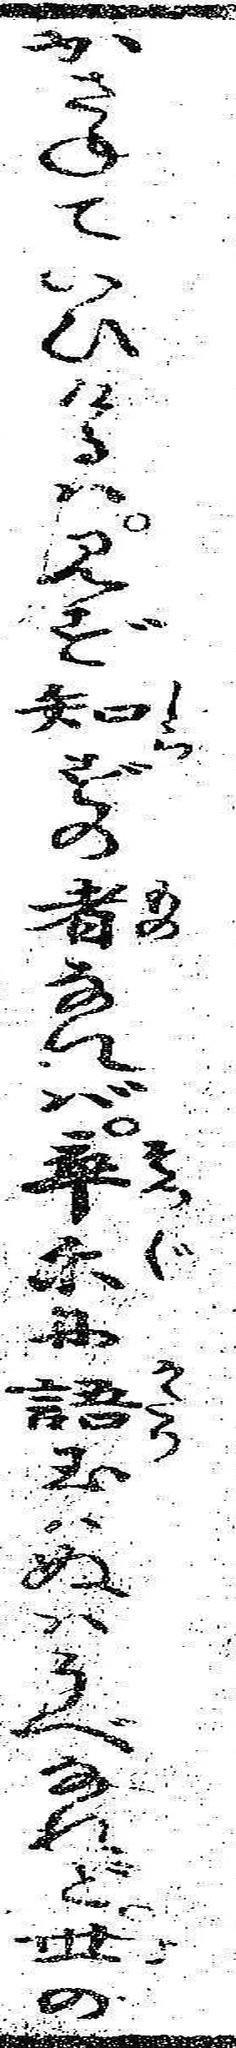かさねていひけるは。見ず知ずの者なれば。卒爾に語玉はぬはうべなれど。世の
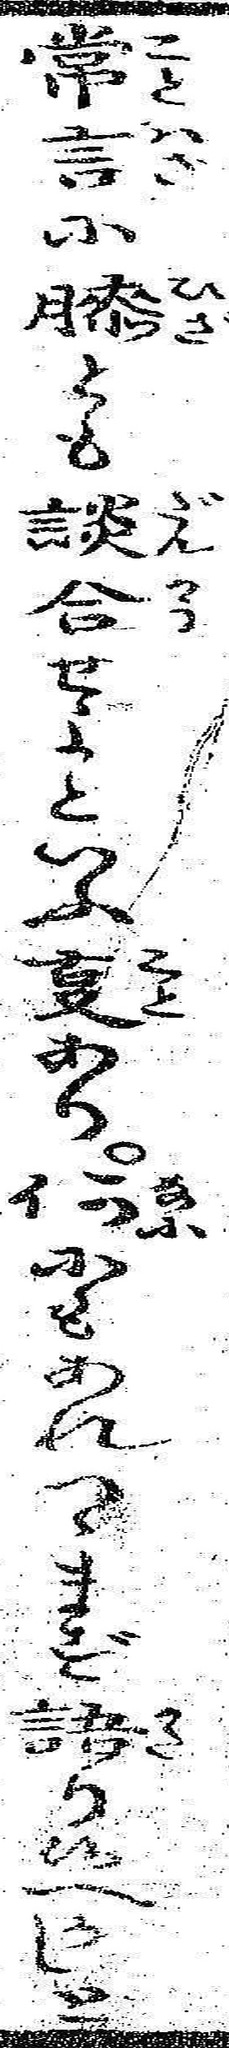常言に膝とも談合せよといふ事あり。何にもあれつゝまず語り候へかしと
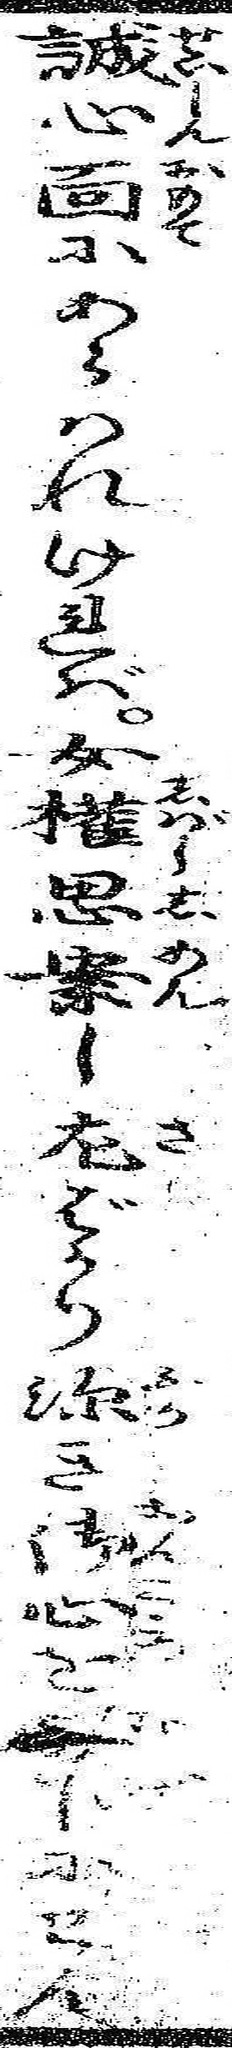誠心面にあらはれければ。女権思案し左ばかり深き御心を無下にせん
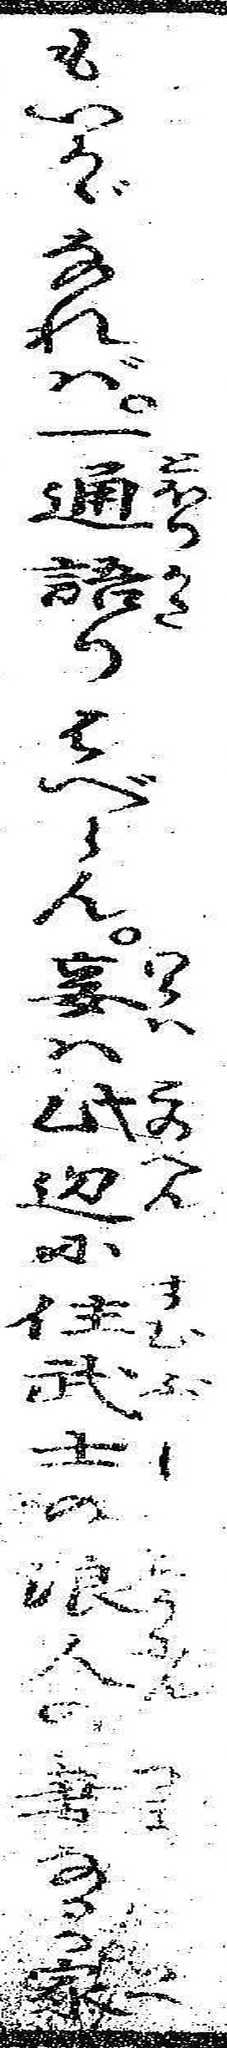もいかゞなれば。一通語りはべらん。妾は此辺に住武士の浪人の妻なるが。家
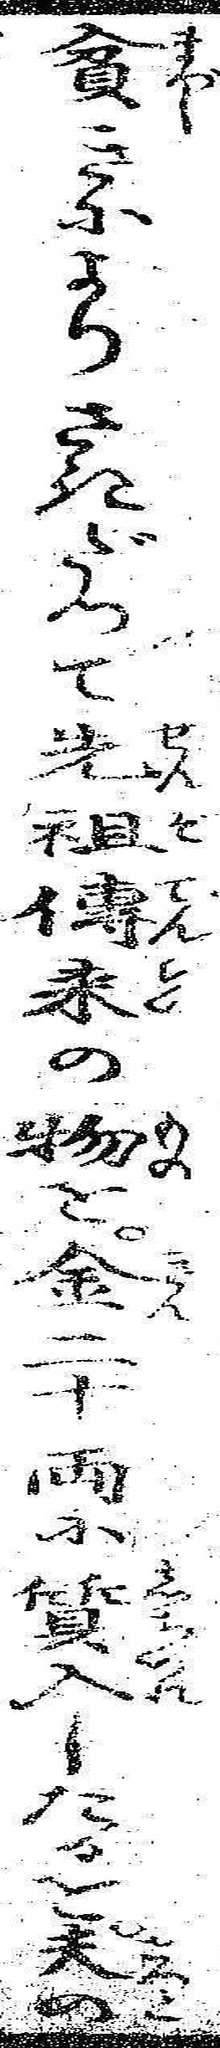貧きによりさきだつて先祖伝来の物を。金二十両に質入したるを。夫の
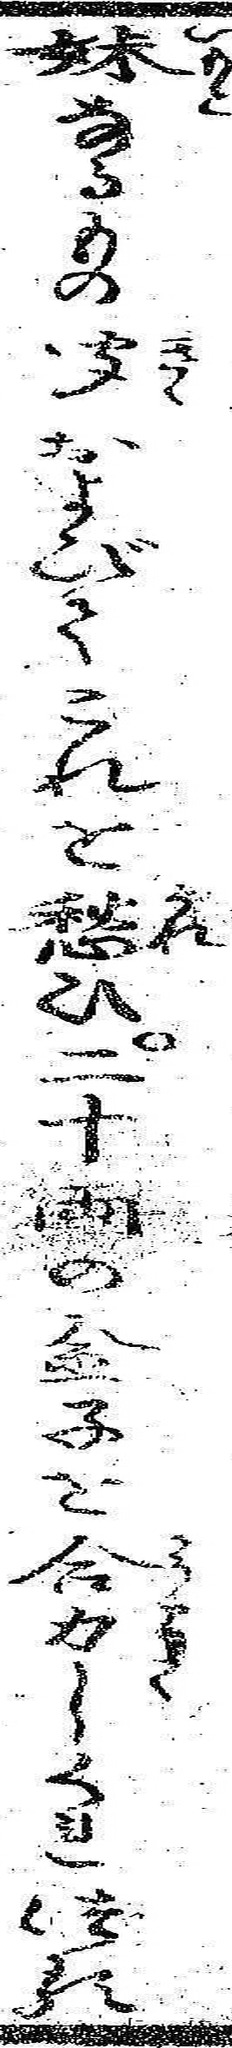妹なるもの聞およびてこれを愁ひ。二十両の金子を合力しくれつる

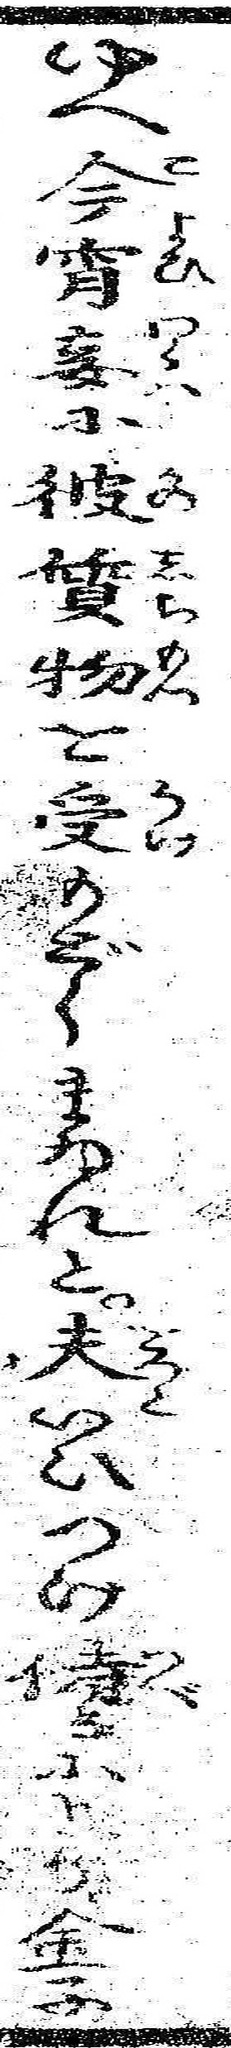ゆへ今宵妾に彼質物を受もどしまゐれと。夫いひつけ侍るにより。金子
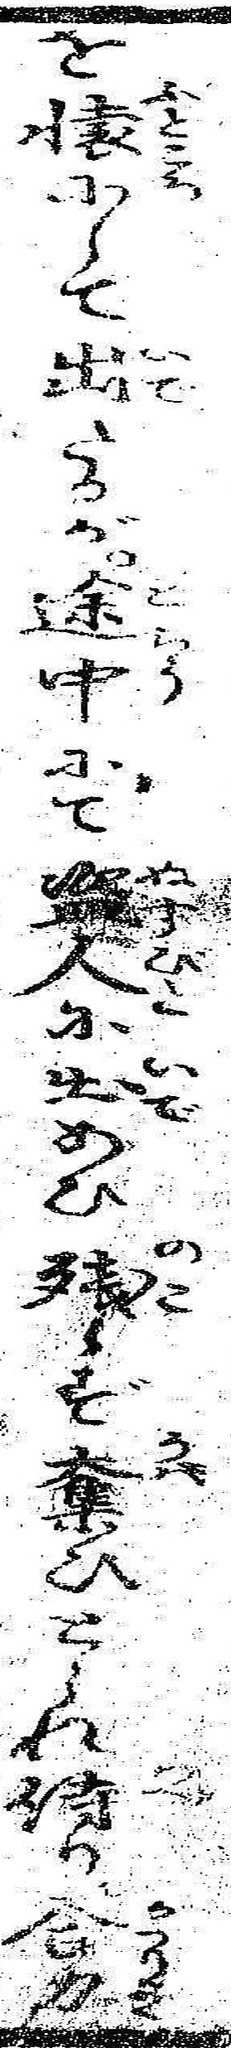を懐にして出たるが。途中にて盗人に出あひ残らず奪ひとられ侍り。合力
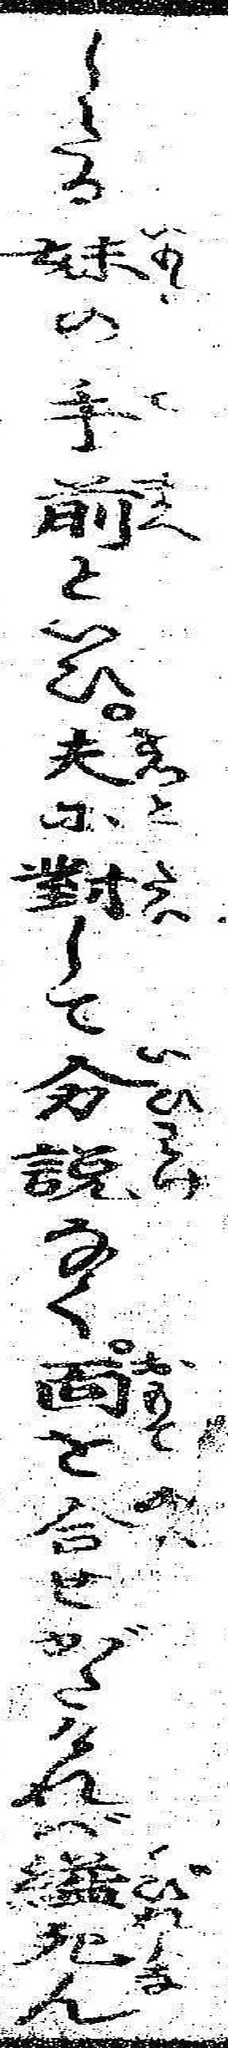したる妹の手前といひ。夫に対して分説なく。面を合せがたければ縊死ん
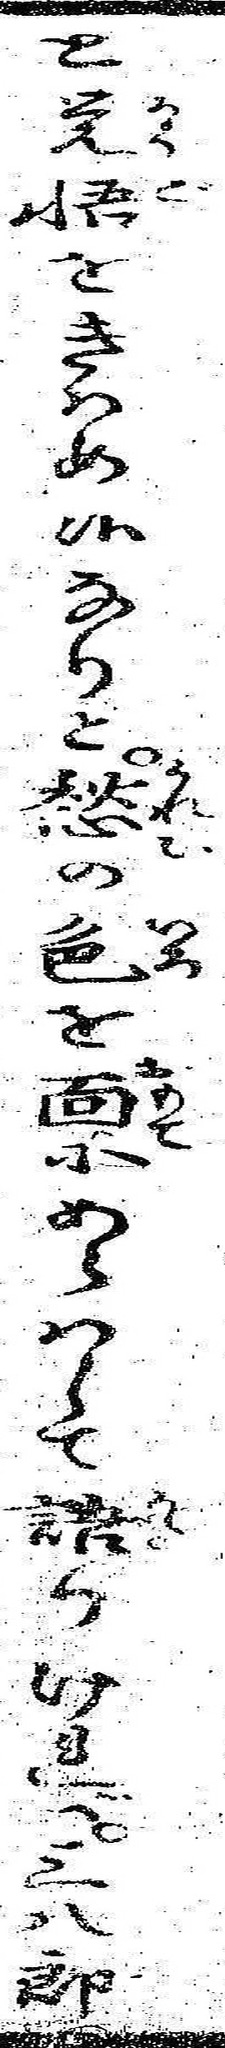と覚悟をきはめ候なりと。愁の色を面にあらはして語りければ。三八郎
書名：昔話稲妻表紙
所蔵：国文学研究資料館
